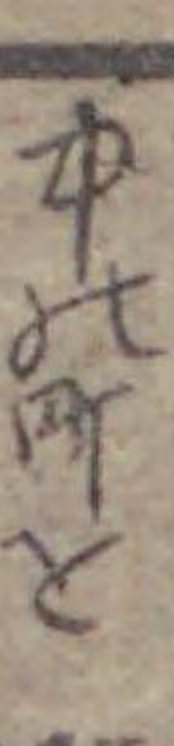中の町を
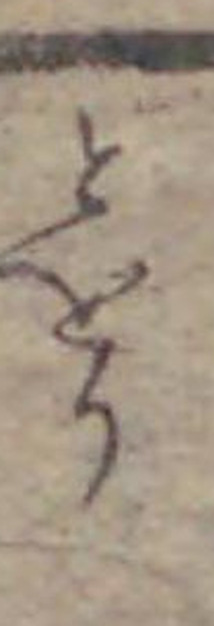とをり
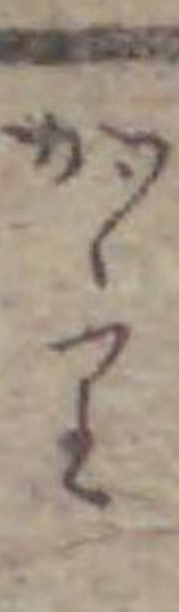かゝり
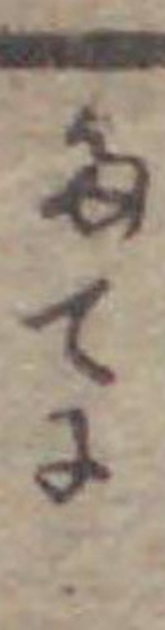たてに
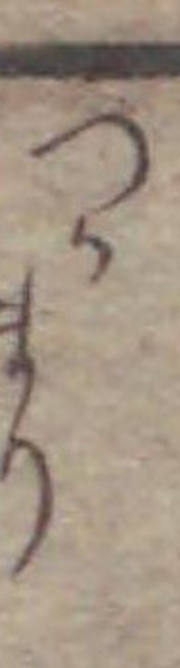つかまり
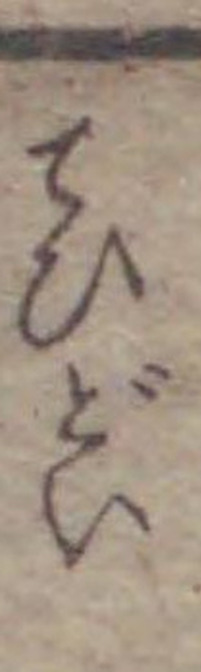てひどい

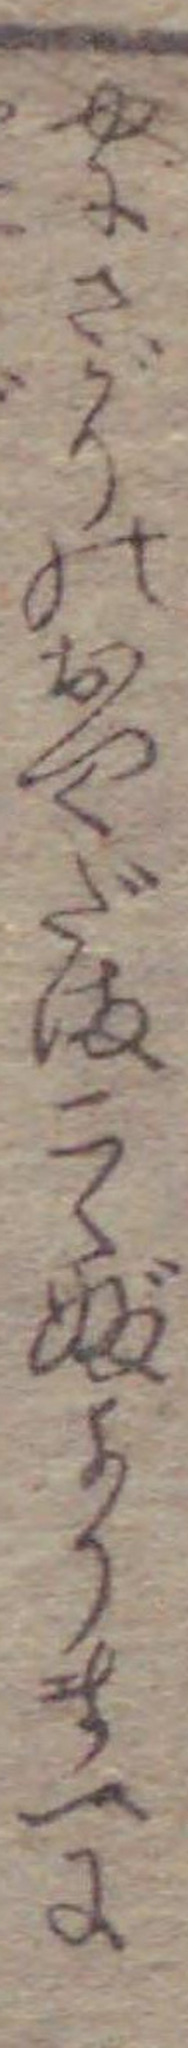やにさがりのおやだまこゝぶよりま一に
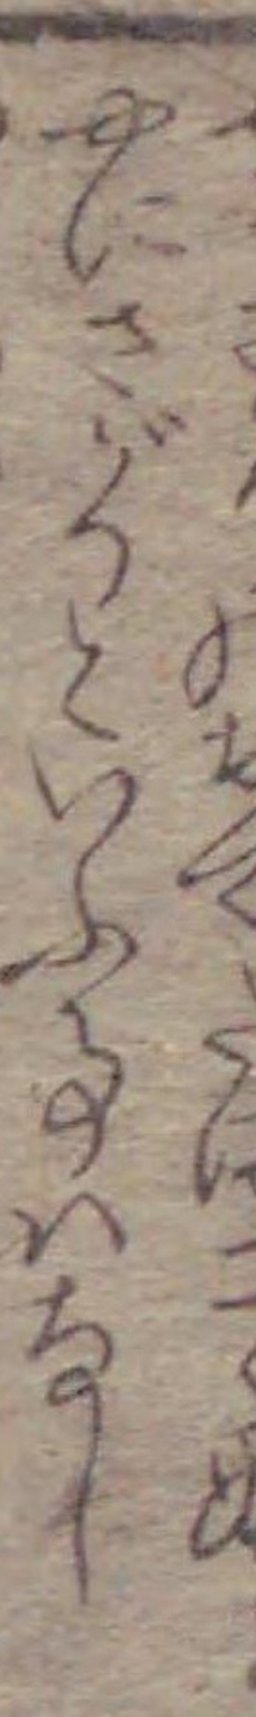やにさがりといふ事はなし
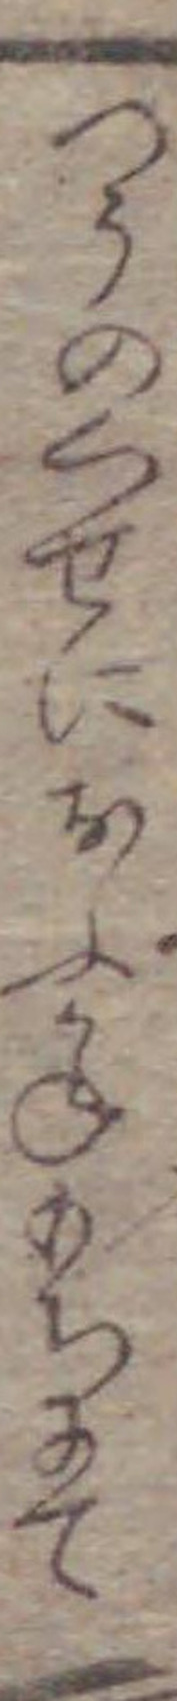つうのくせにおふかねもちにて
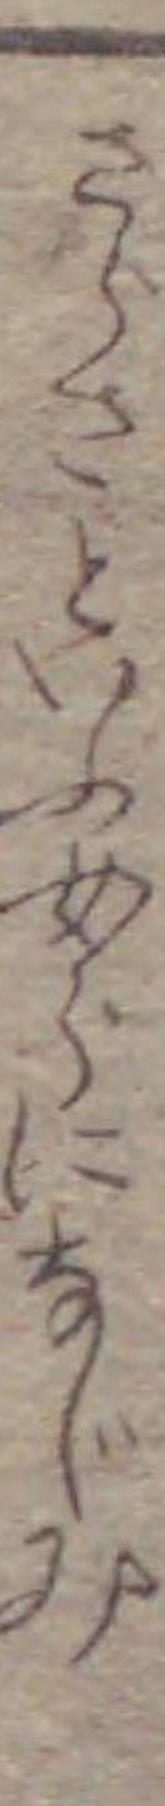さらさといふ女郎になじみ
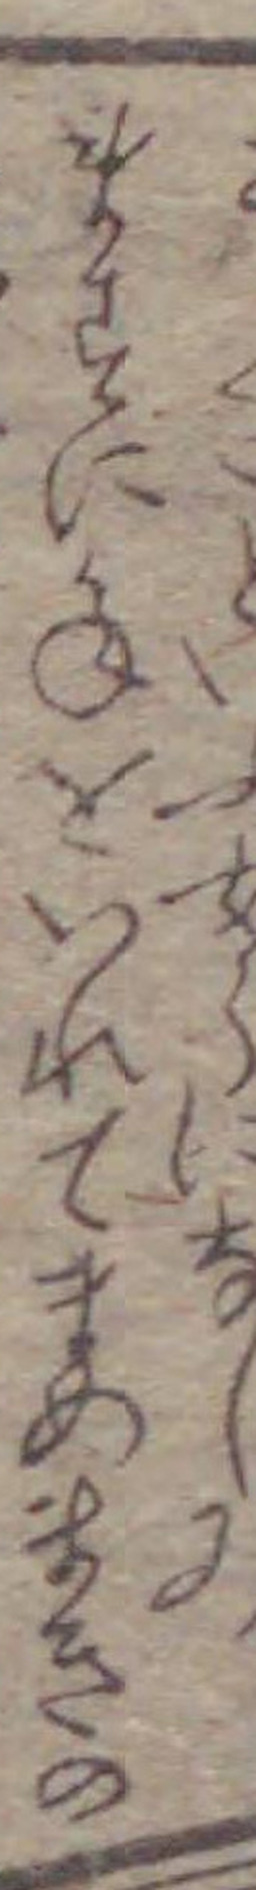ますにかねをいれてまめまきの
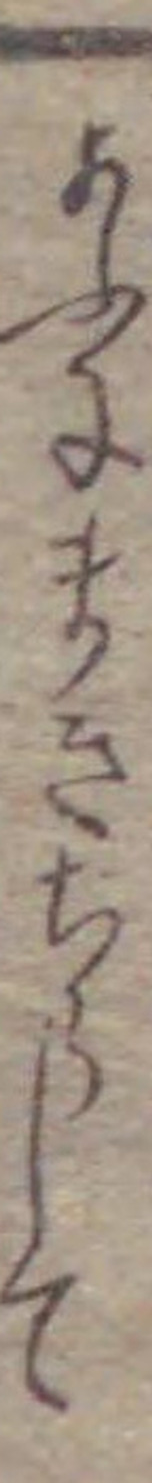よふにまきちらして
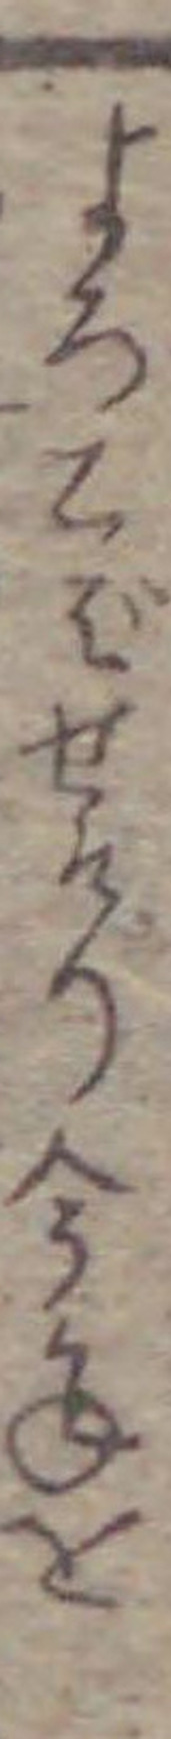よろこばせけり今かねを
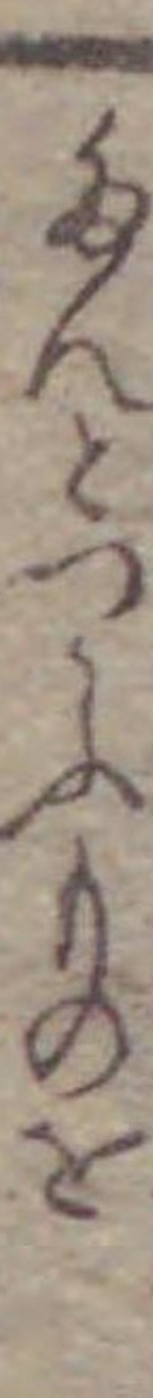たんとつかふものを
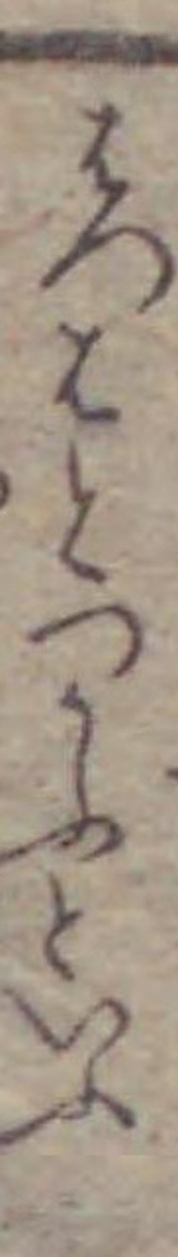はつはとつかふといふ
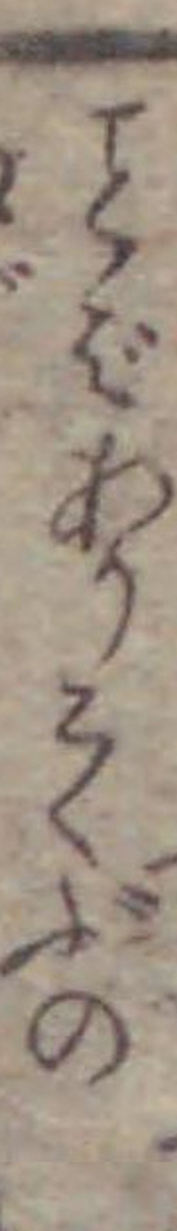ことばありこくぶの
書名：談芭菰誉詞 : 3巻
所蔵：国立国会図書館 National Diet Library, JAPAN
